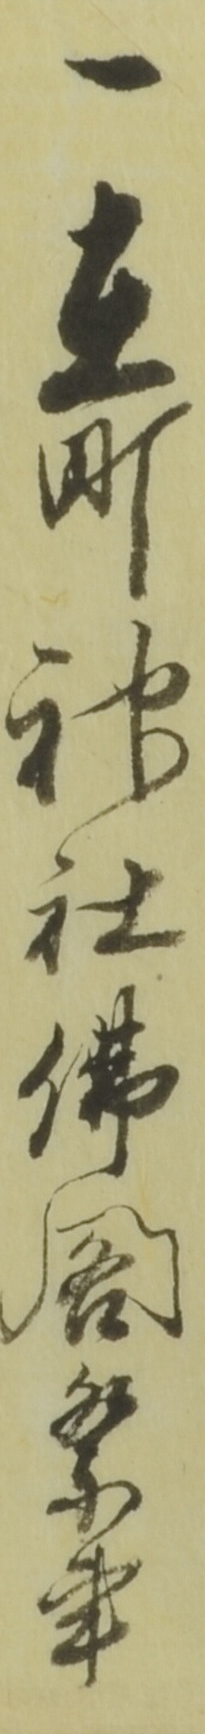一在町神社仏閣祭事
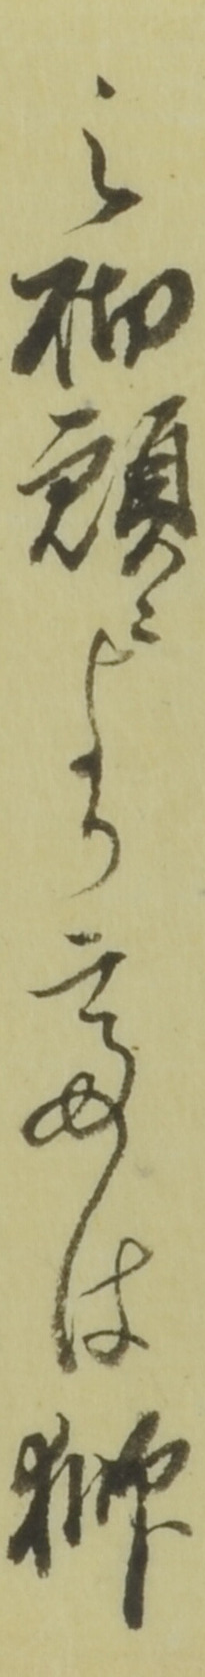之砌願ニよりては獅
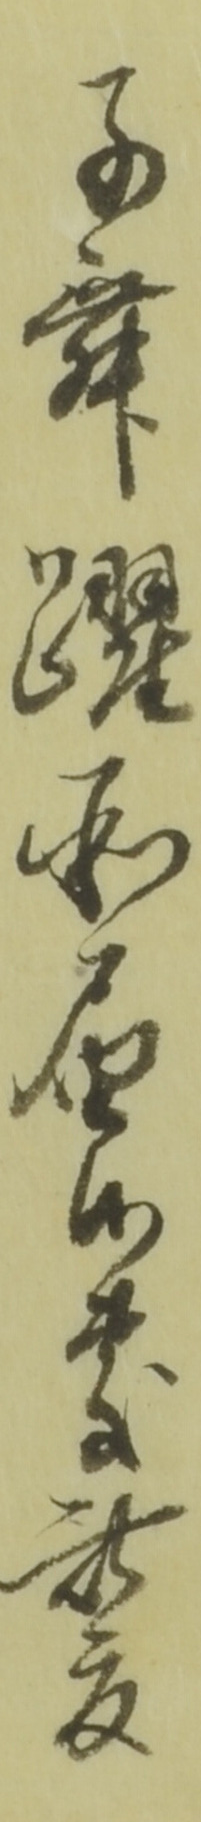子舞躍承届候処此度
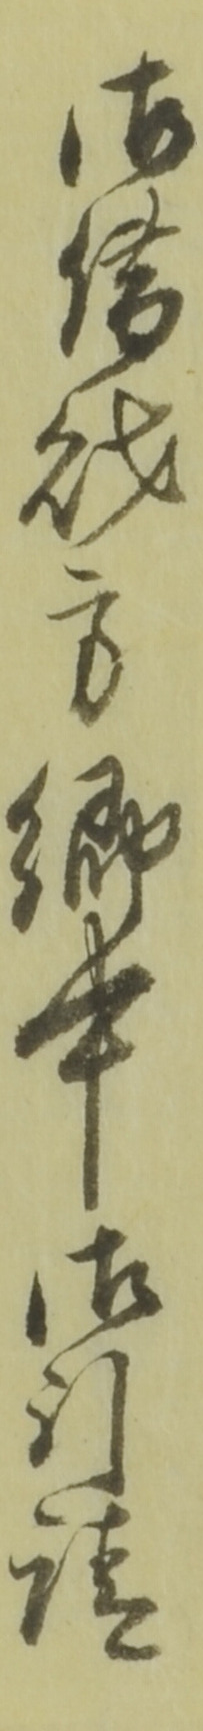御借財方郷中御引請
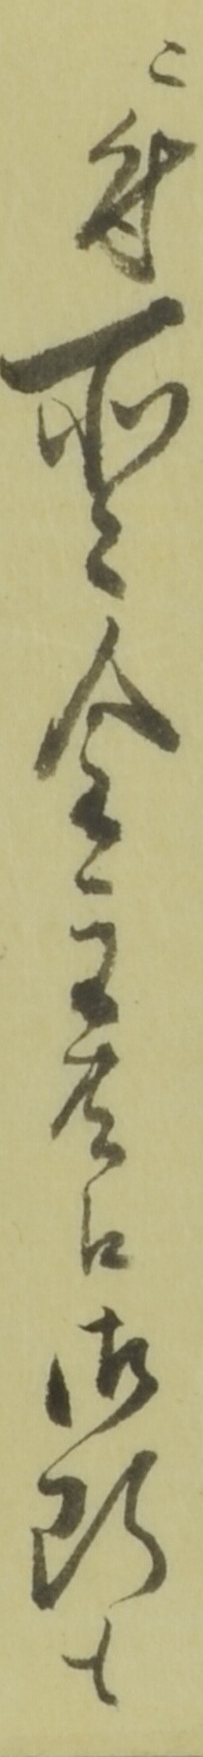ニ付所々金主共江御断も
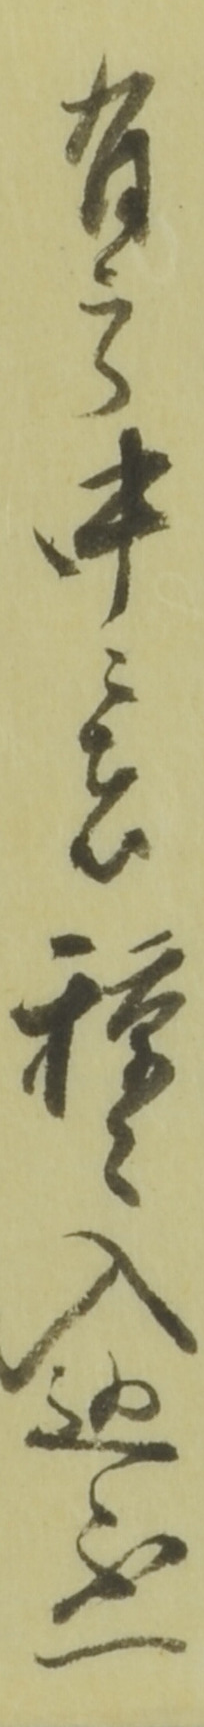有之中ニは種々入込不一
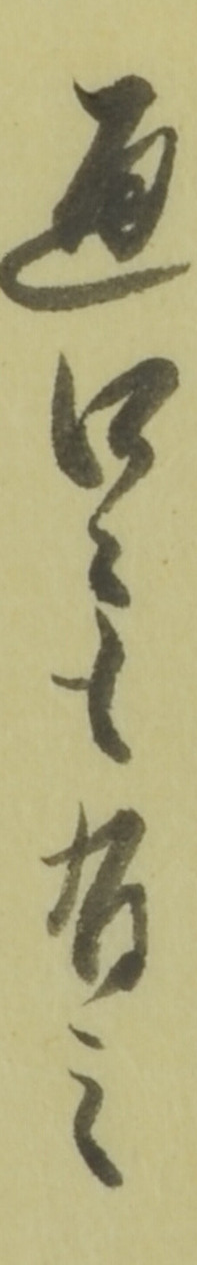通口々も有之
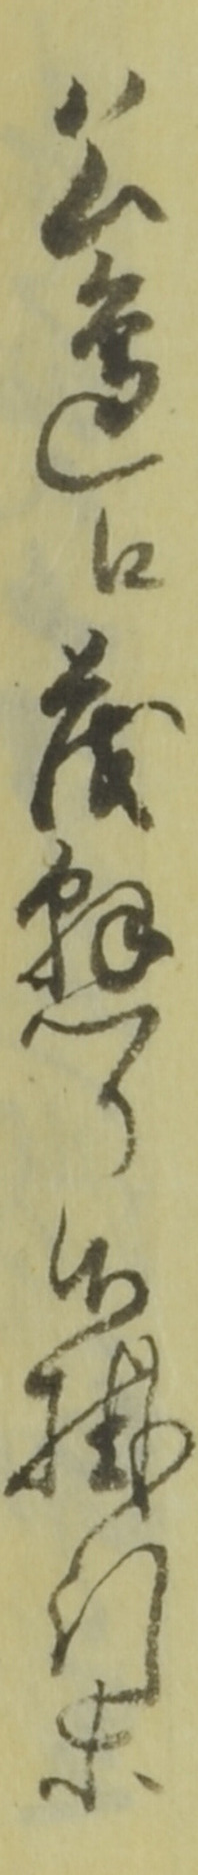公辺江も懸り候掛引等
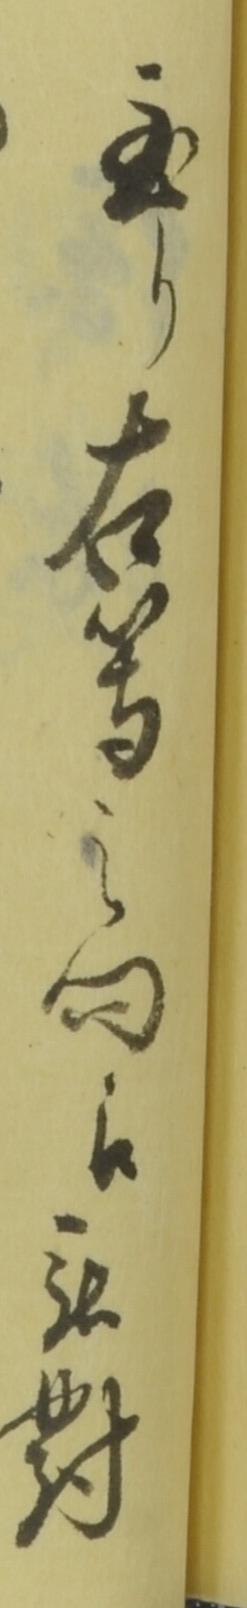至り右等之向江被対
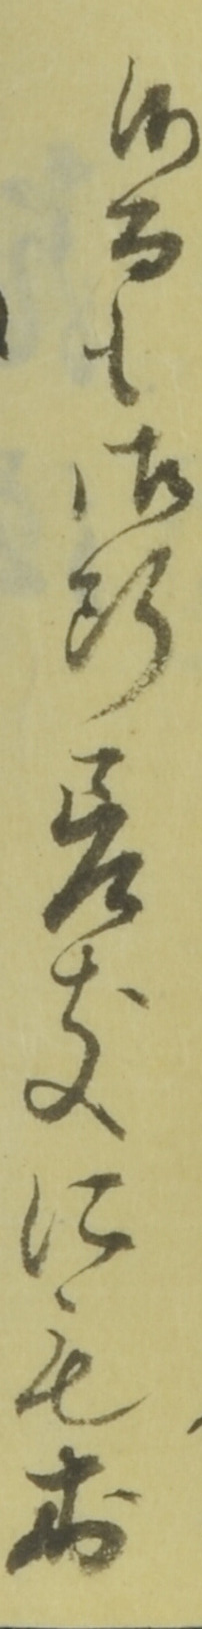候而も御断差支にもお
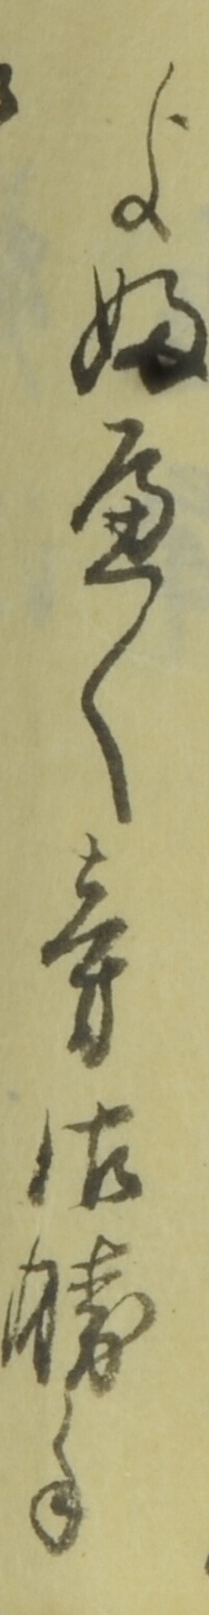よふへく旁御勝手

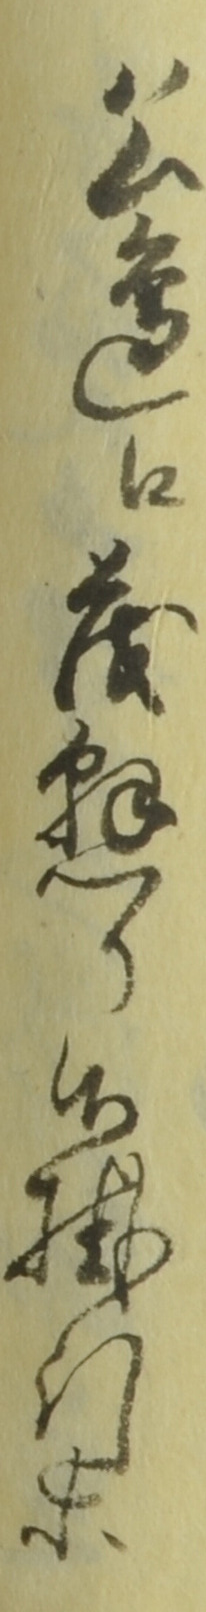公辺江も懸り候掛引等
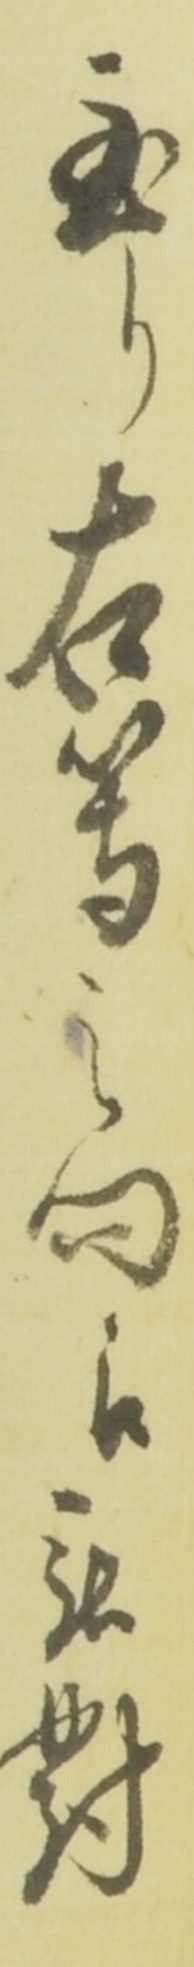至り右等之向江被対
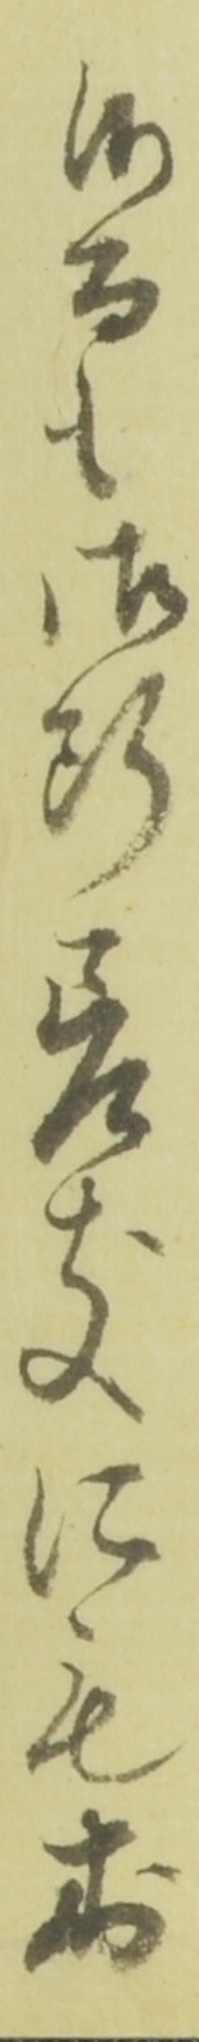候而も御断差支にもお
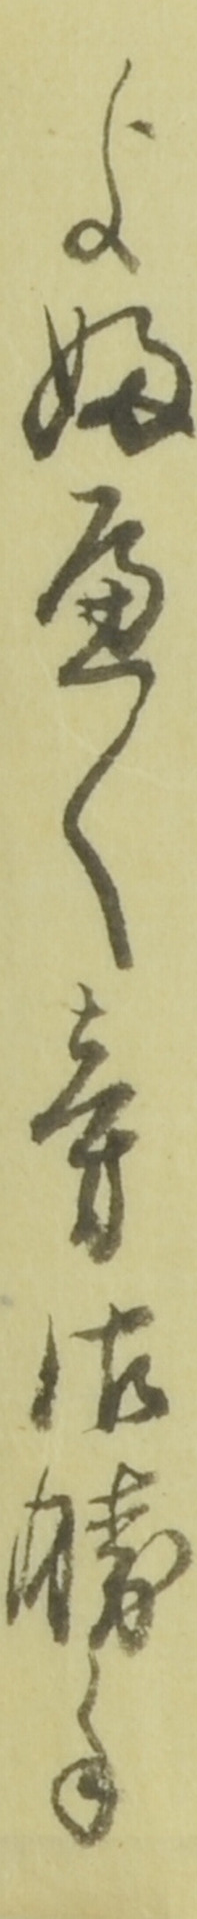よふへく旁御勝手
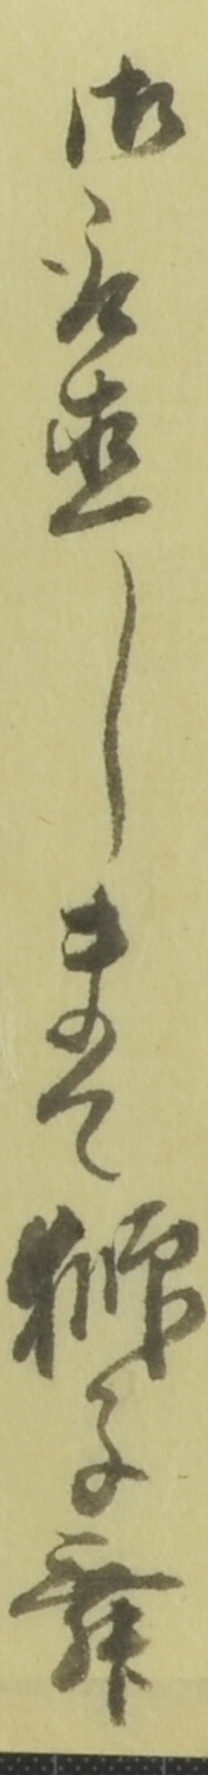御取直しまて獅子舞
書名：御触書御書附控
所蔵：伊那市立高遠町図書館・合同会社AMANE
